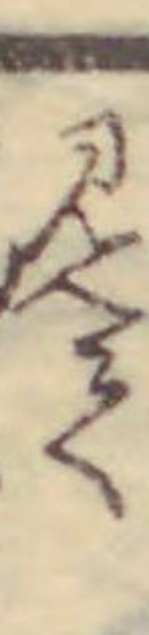見へて
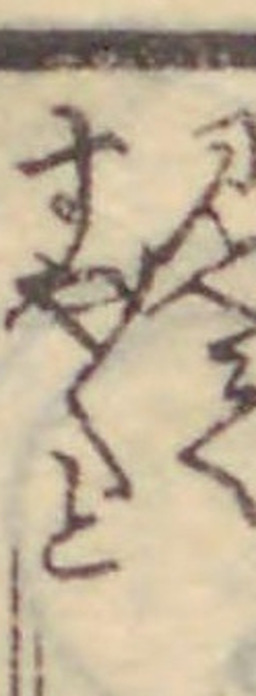すや〳〵と
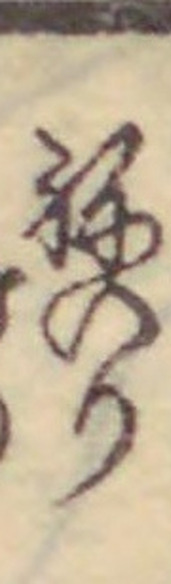ねいり

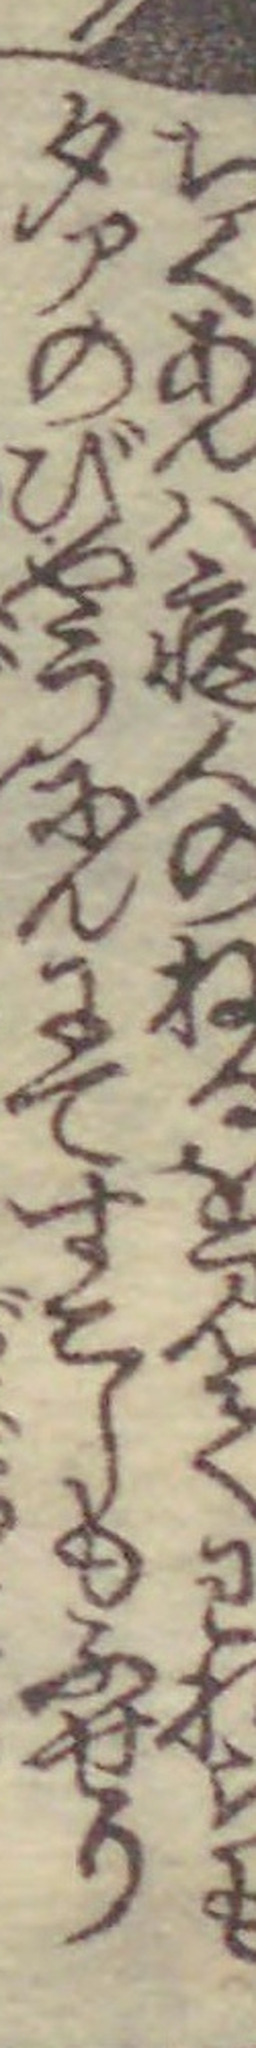夕部のびやうにんにてすこしもふせり
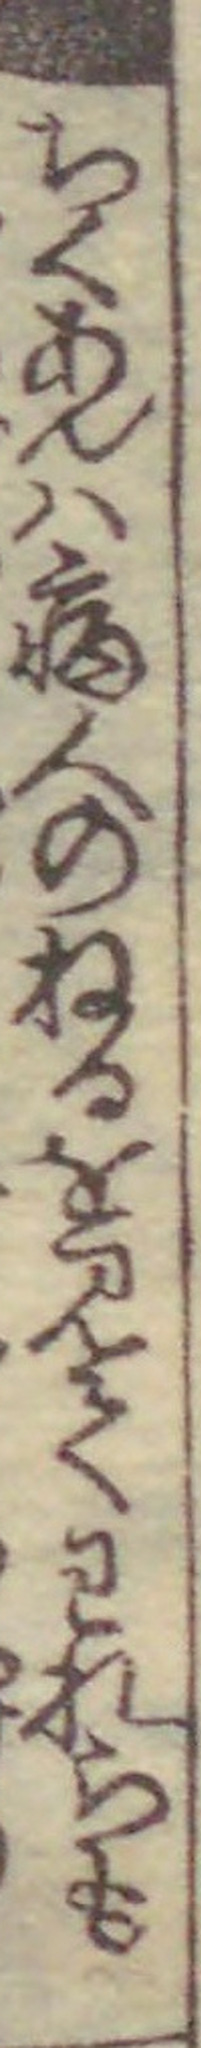ちくあんは病人のねるを見てわれらも
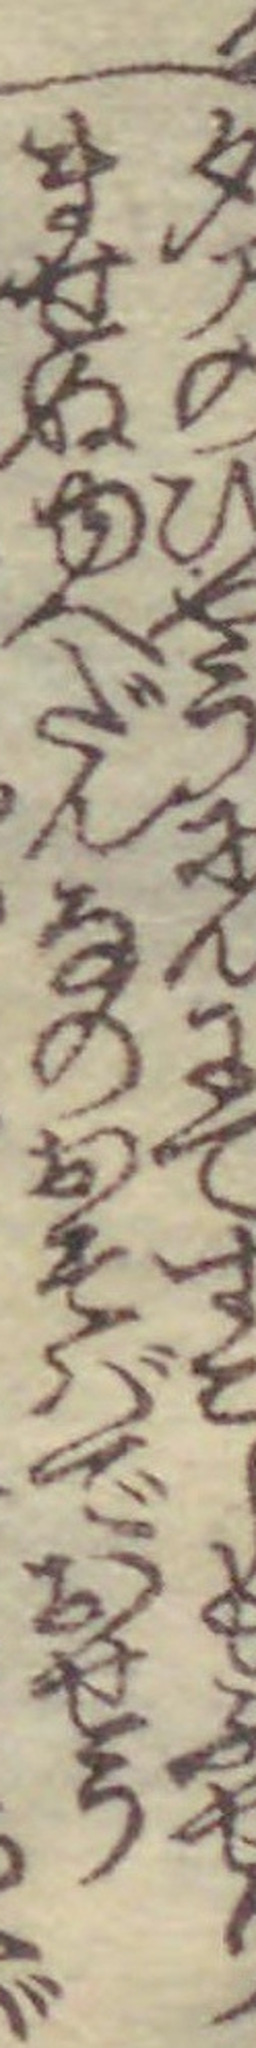ませぬゆへだんなのおそばでおせう
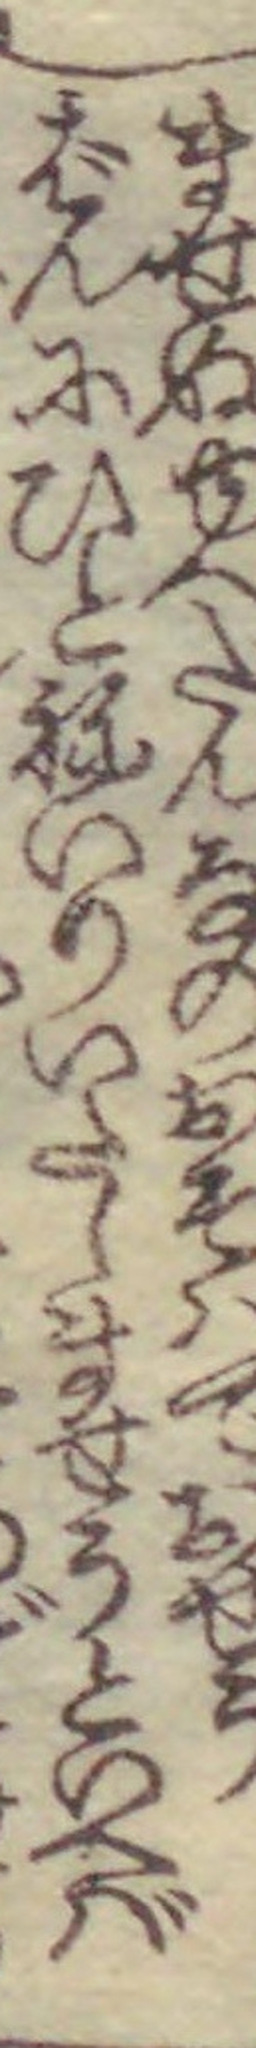ばんにひとねいりいたしませうといへば
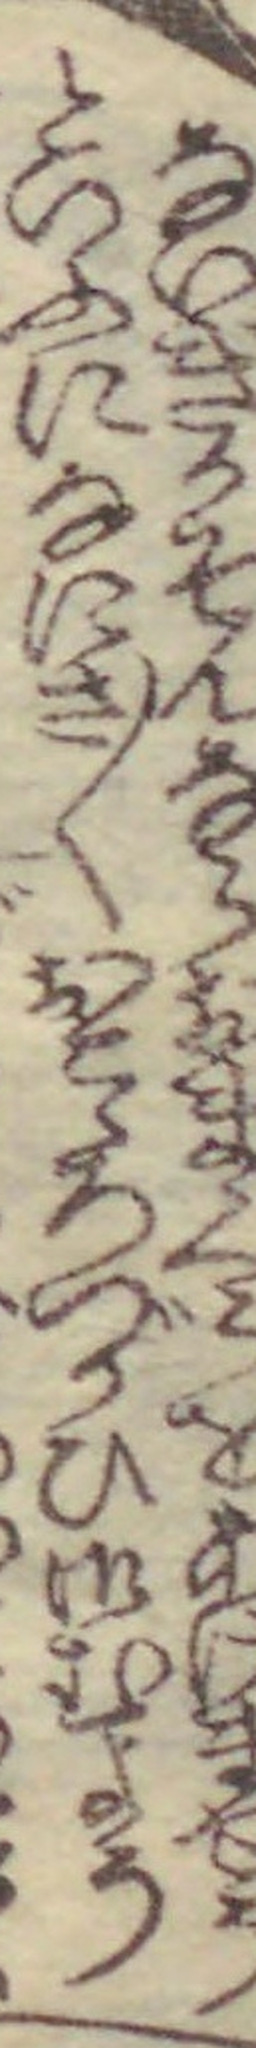といふになにさ〳〵おこゝろづかひ御むよう
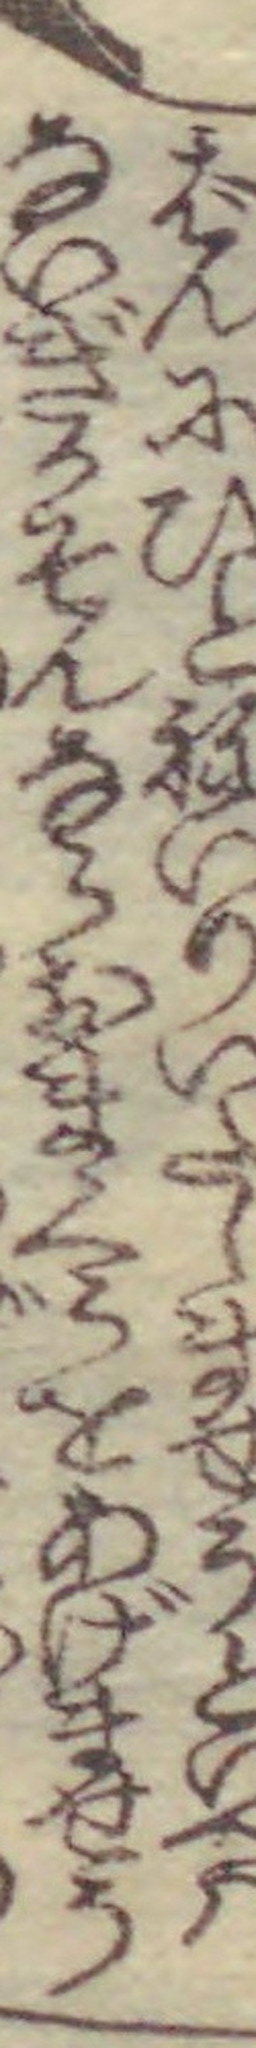ないぎかそんならおまくらをあげませう
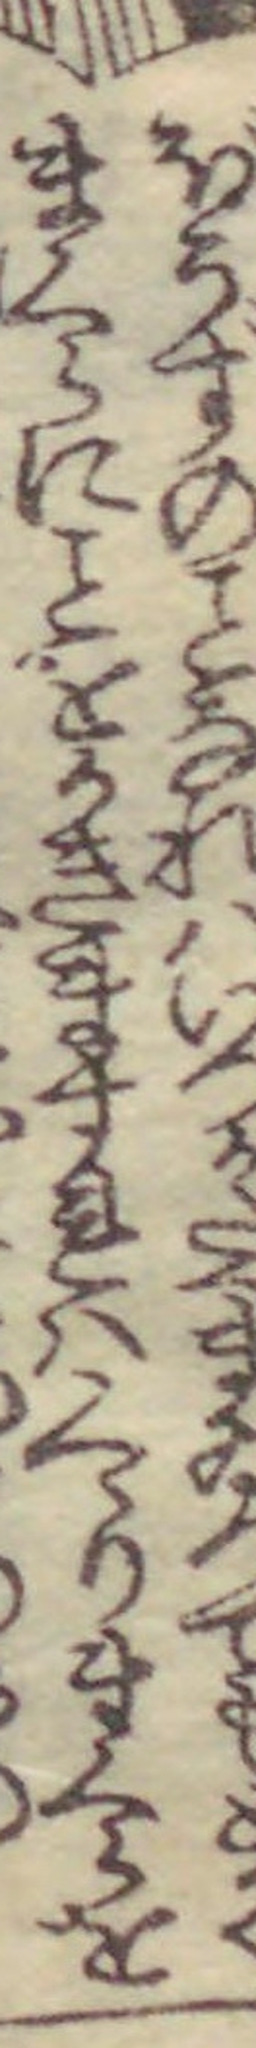まくらにことをかきますれはくゝりまくらを
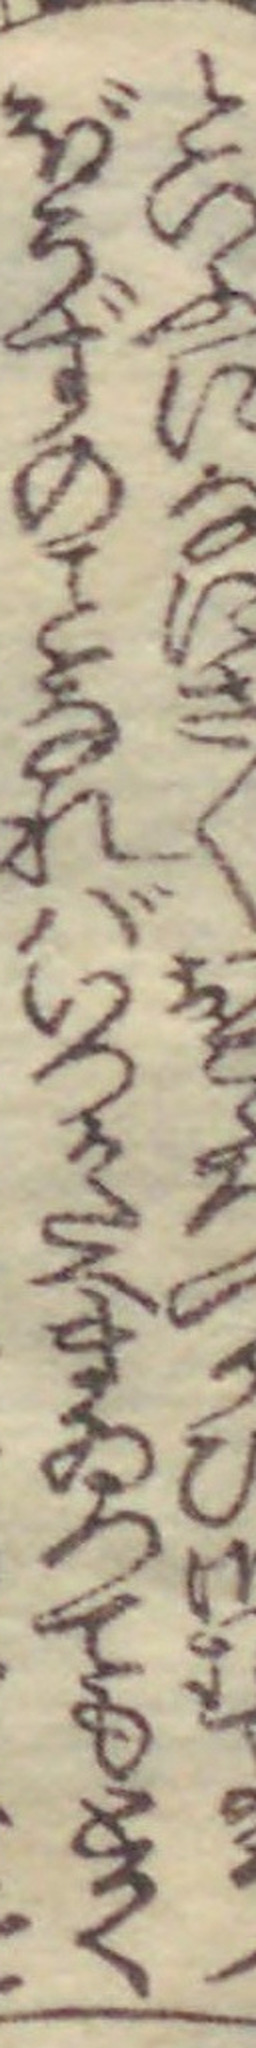ぼうずのことなればいつかたへまゐつてもとかく
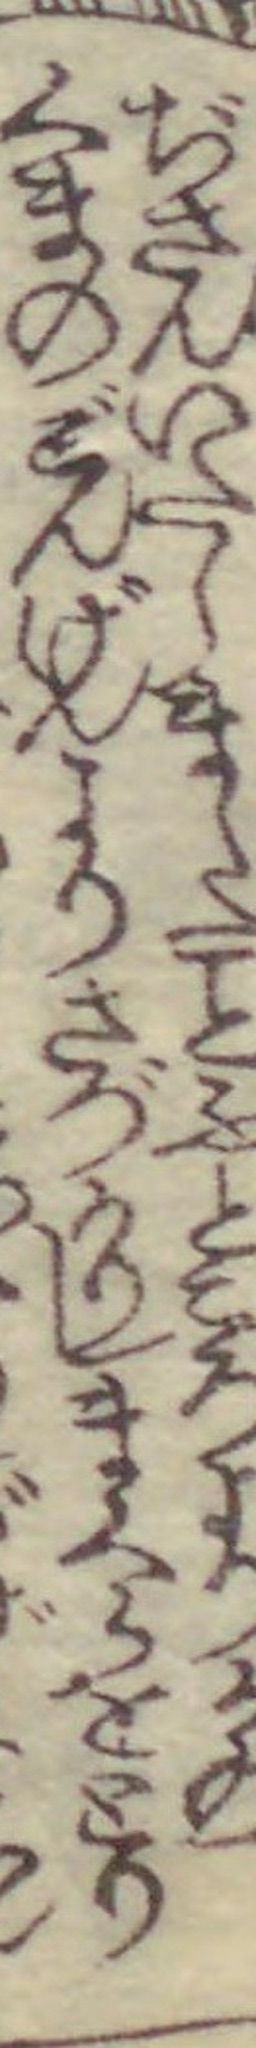くまのごんげんよりさづかりしまくらをとり
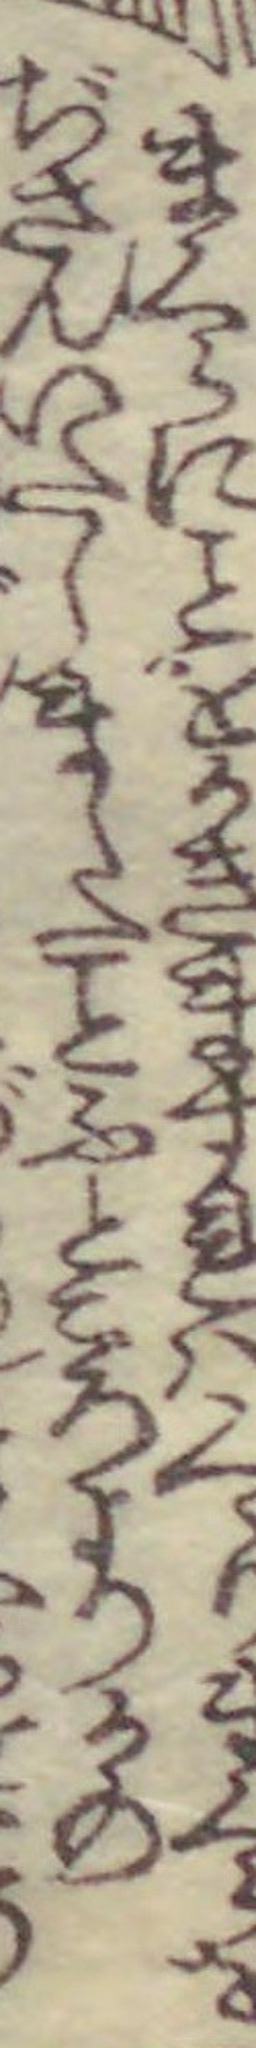ぢさんいたしましたとふところよりかの
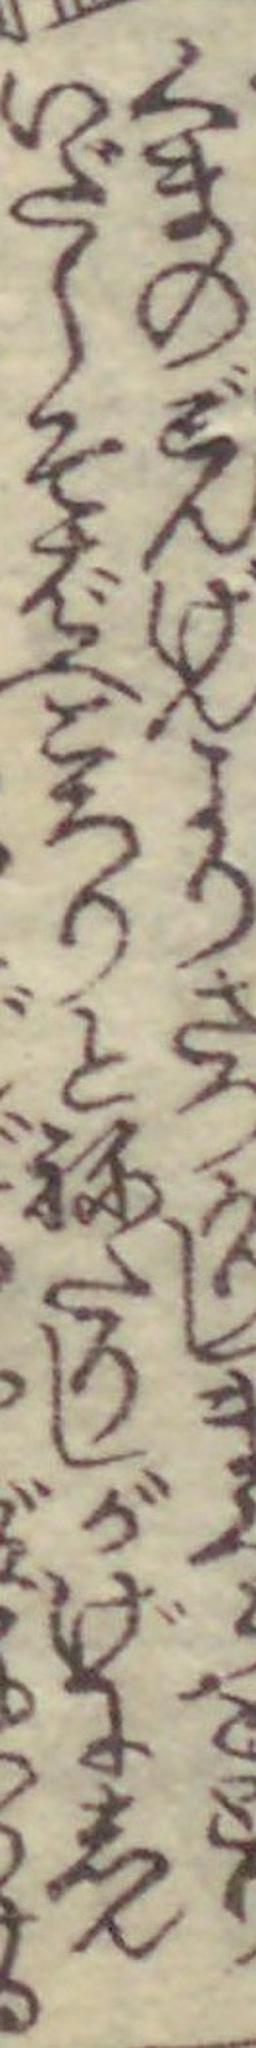いだしそばへころりとねたりしがげにしん
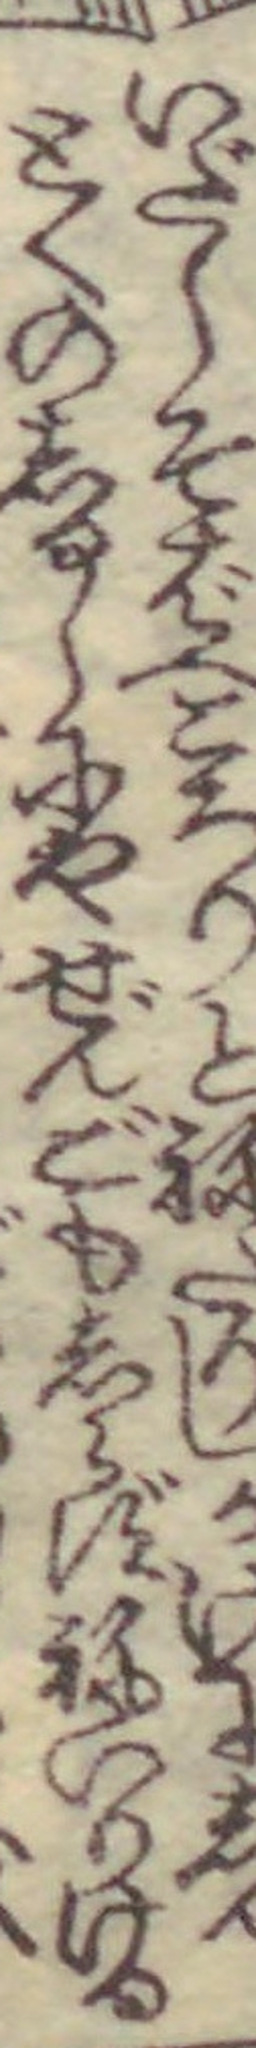とくのしるしにやぜんごもしらずねいりける
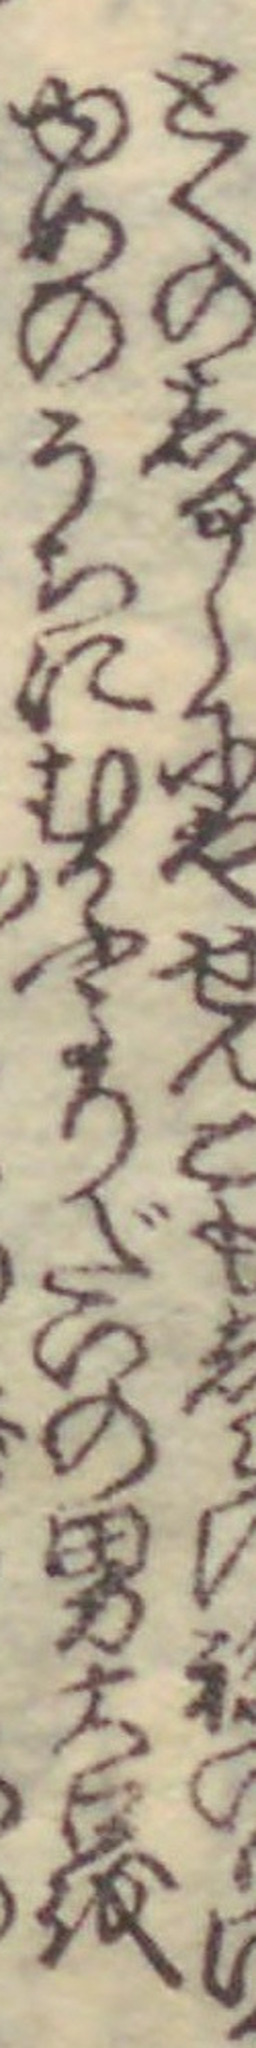ゆめのうちにむかふよりだいの男大口を
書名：腹内窺機関 2巻
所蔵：国立国会図書館 National Diet Library, JAPAN
